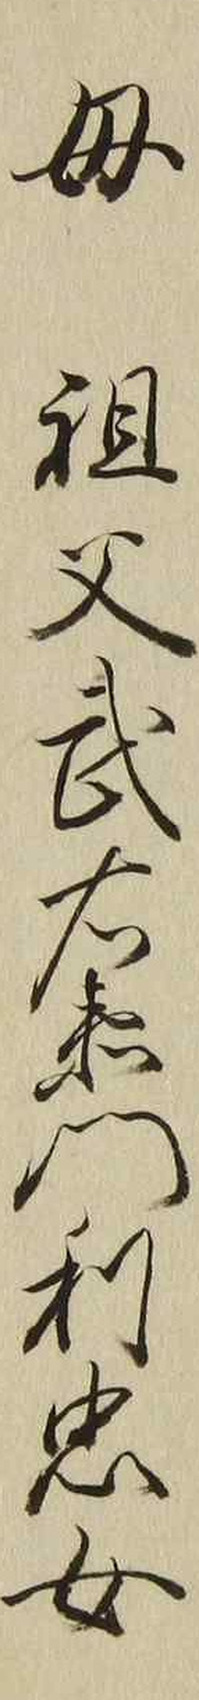母祖父武右衛門利忠女

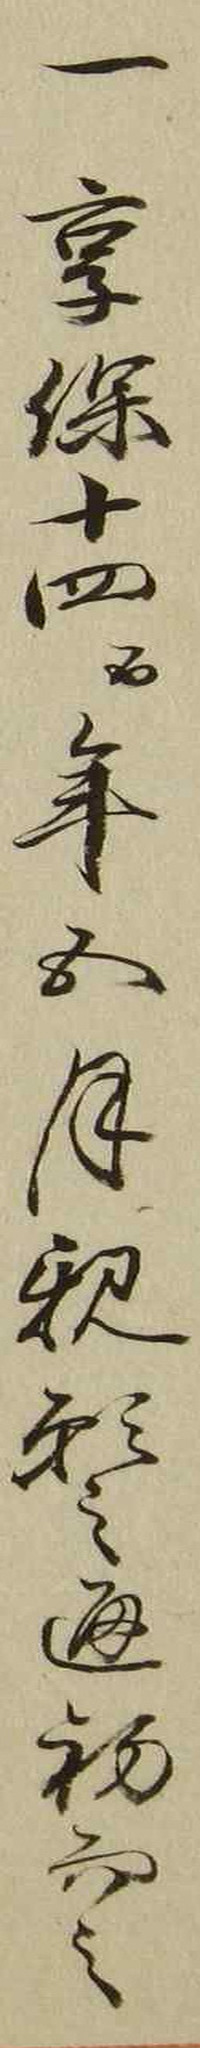一享保十四酉年五月親願之通初而之
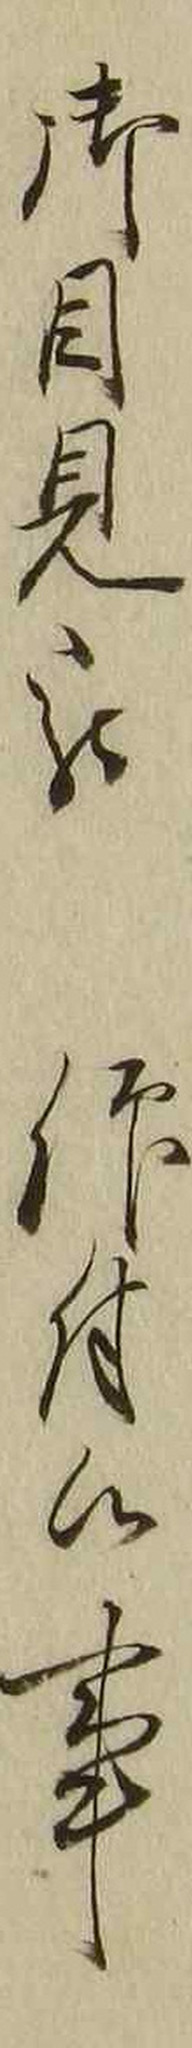御目見被仰付候事
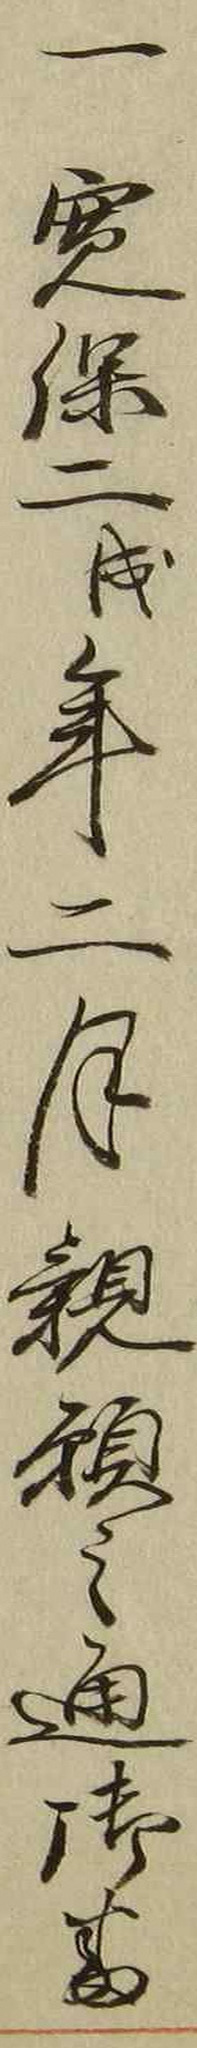一寛保二戌年二月親願之通御番
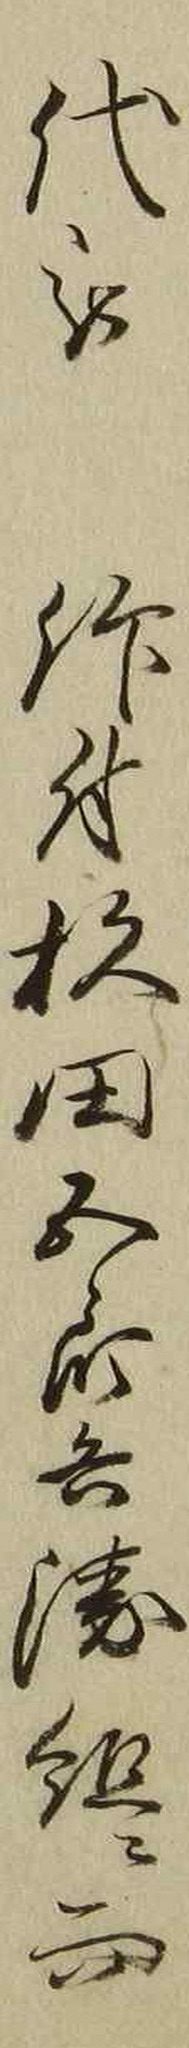代被仰付杦田五郎兵衛組ニ而
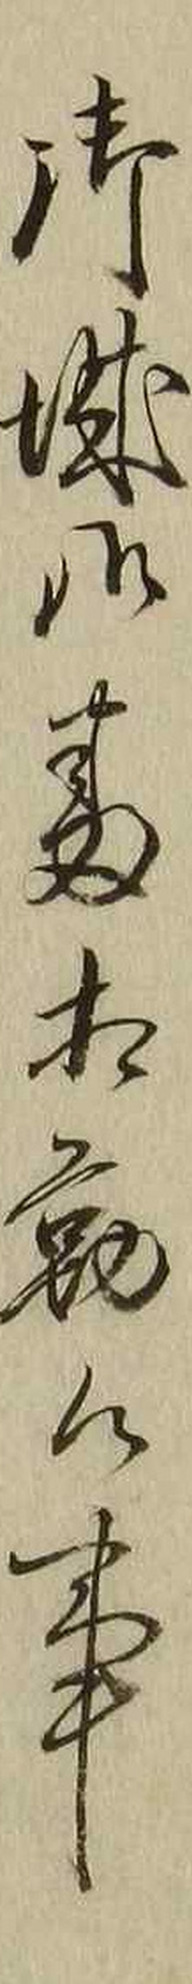御城御番相勤候事
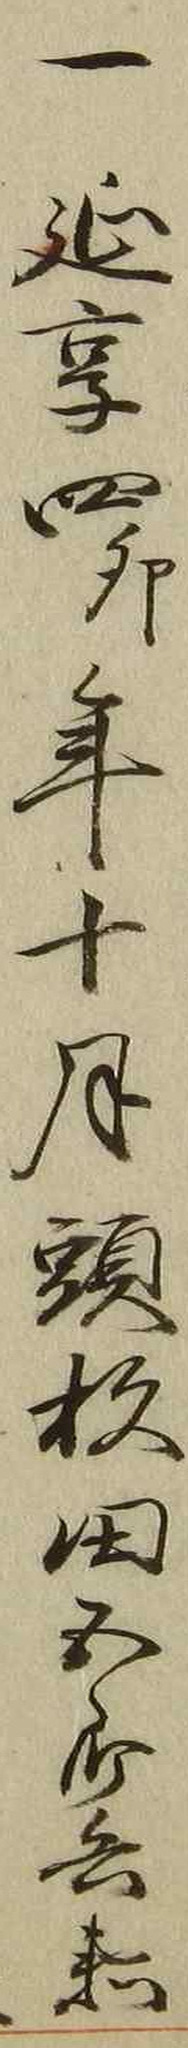一延享四卯年十月頭杦田五郎兵衛
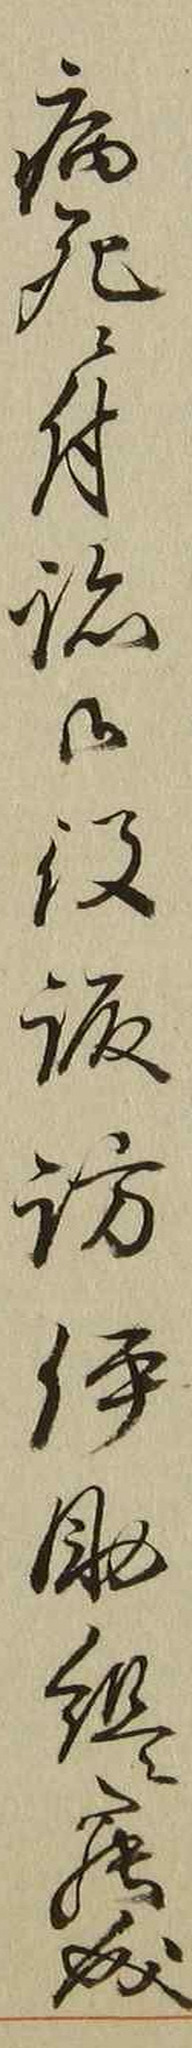病死ニ付跡役諏訪伊助組ニ罷成
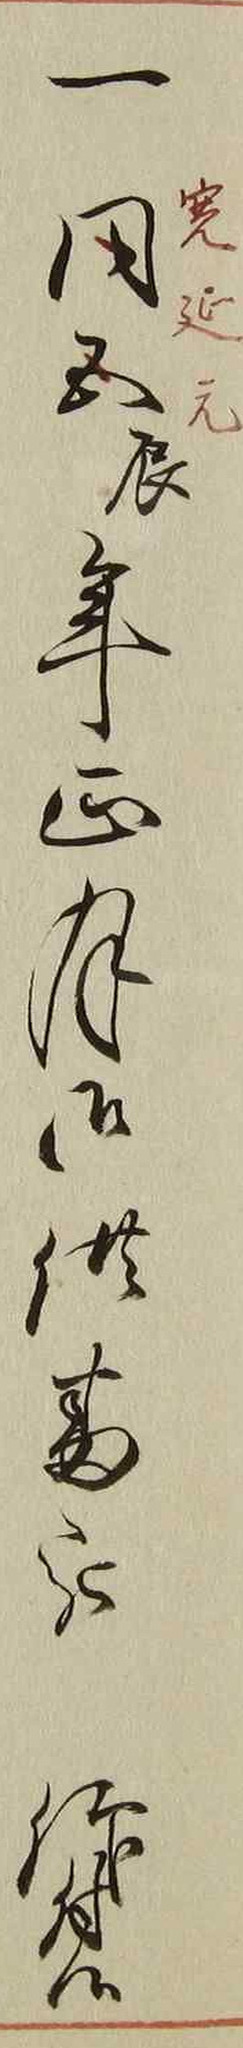一同五辰年正月御供番被仰付候
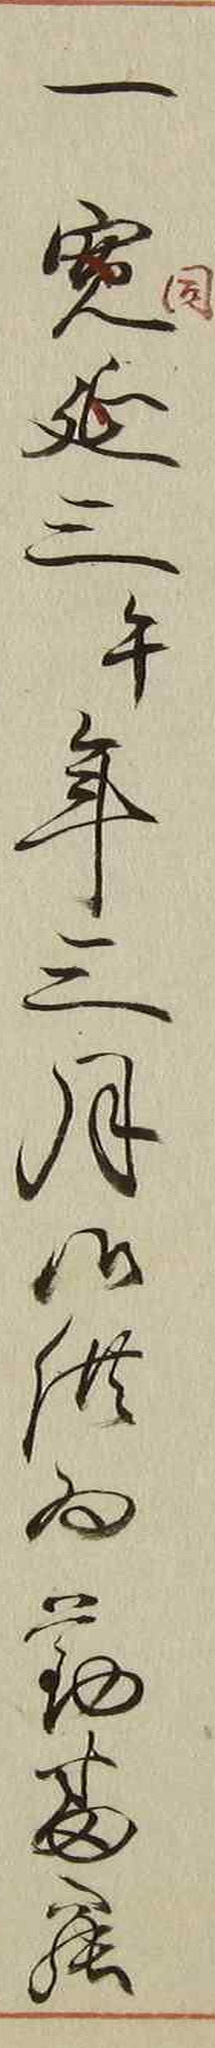一寛延三年三月御供為勤番罷
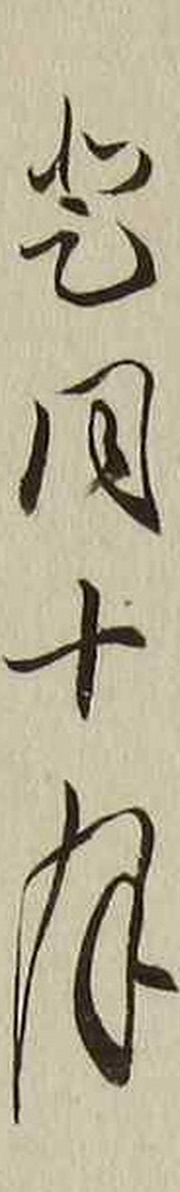登同十月
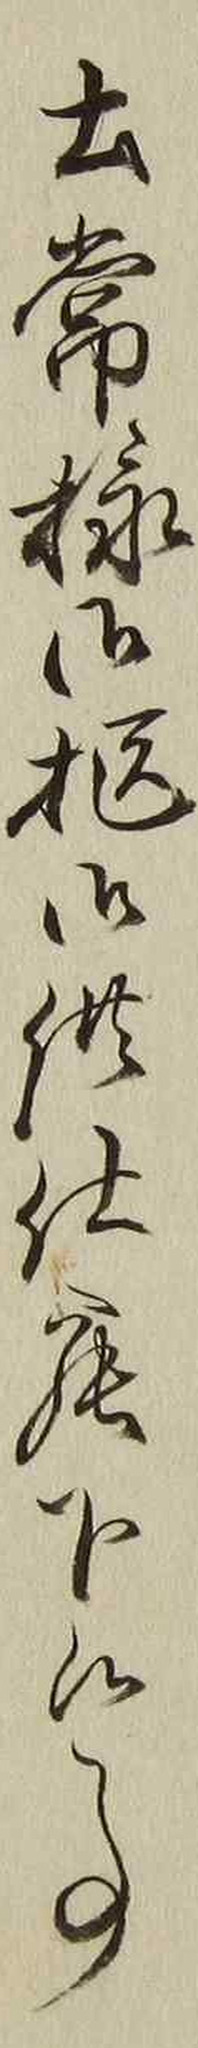土常様御柩御供仕罷下候事
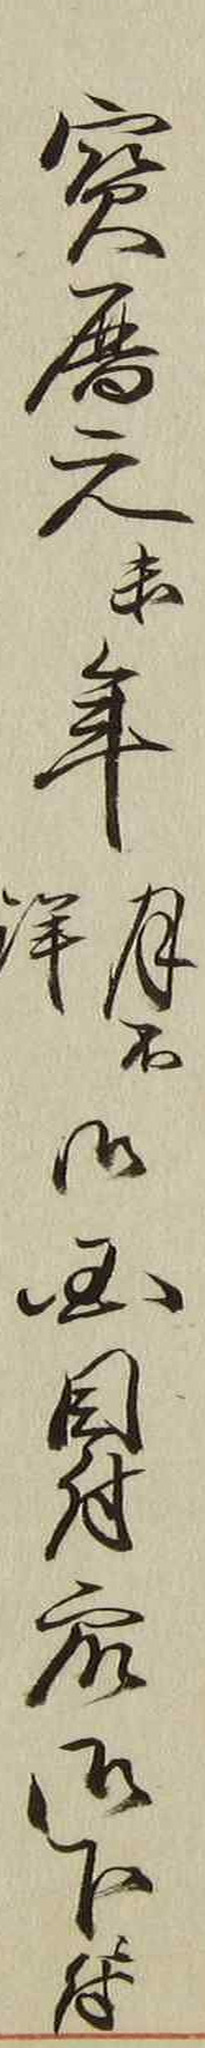一宝暦元未年月不詳御国目付衆御下ニ付
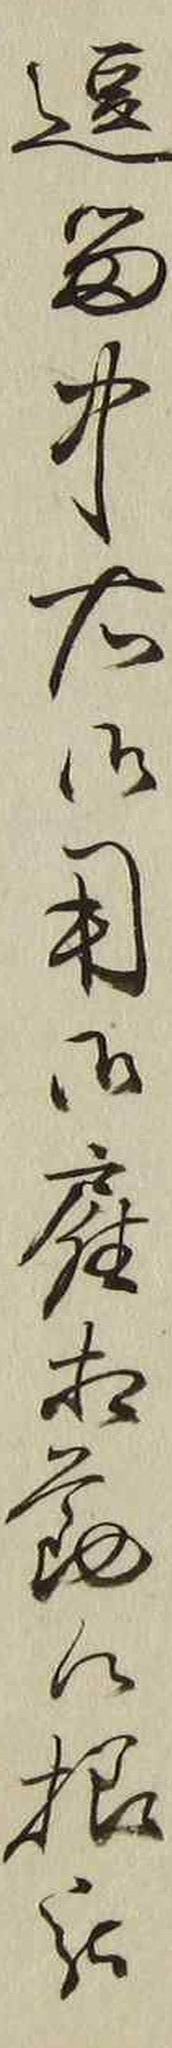逗留中右御用御雇相勤候様被
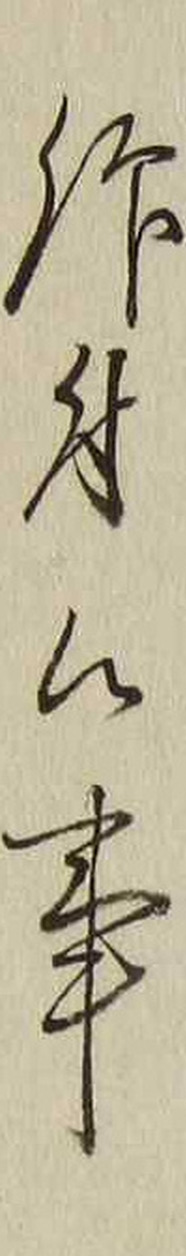仰付候事
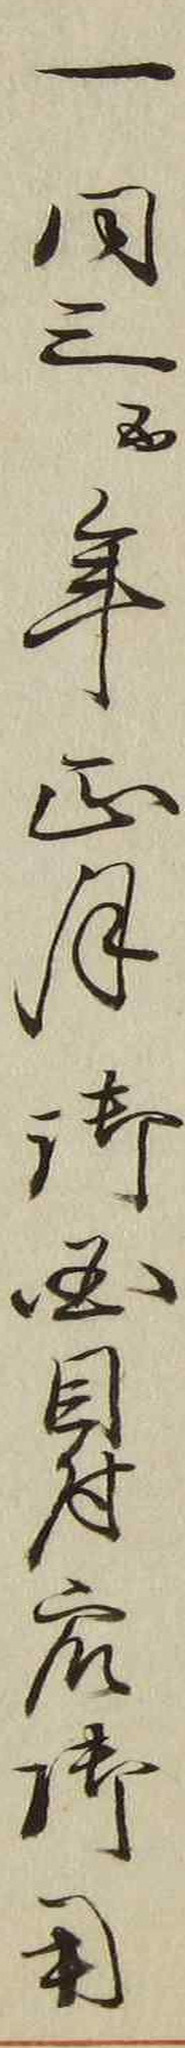一同三酉年正月御国目付衆御用
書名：諸士系譜　巻之54　ほ之部1
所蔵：会津若松市立会津図書館
